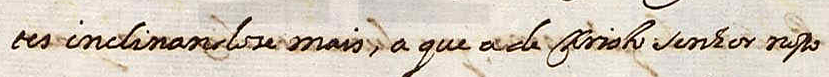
tes inclinandose mais, a que a de Christo senhor nosso
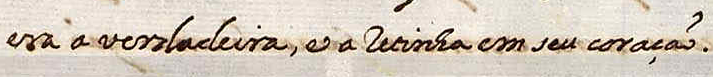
era a verdadeira, e a retinha em seu coraçaõ.
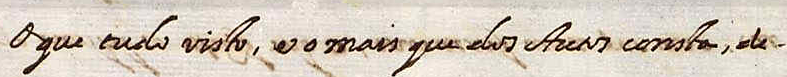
O que tudo visto, e o mais que dos Autos consta, de
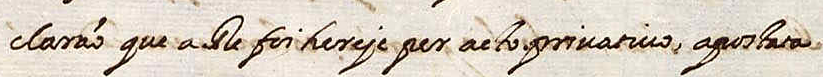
declaraõ que a Re foi hereje per acto priuatiuo, apostata
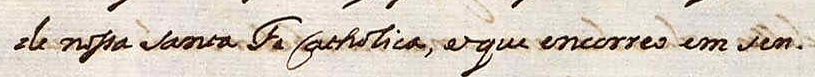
de nossa santa Fe Catholica, e que encorreo em sen
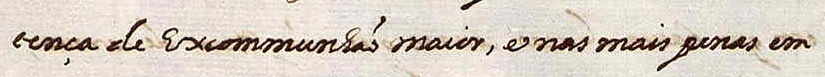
tença de Excommunhaõ maior, e nas mais penas em
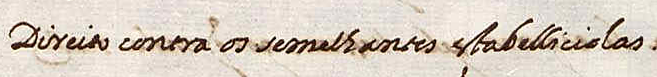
Direito contra os semelhantes estabellicidas.
